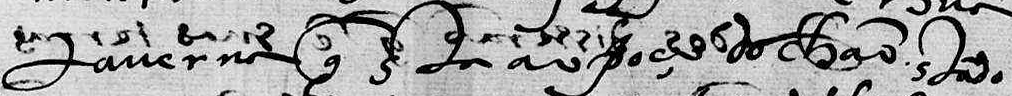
tauerna q̄ sta ao poço do chaõ stāndo
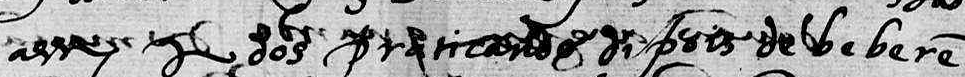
assy todos praticando depois de beberē
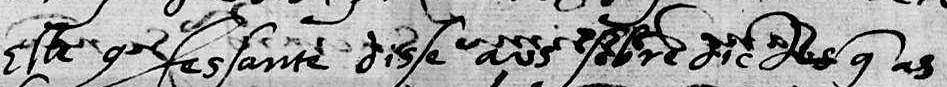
Elle ꝯfessante disse aos sobredictos q̄ as
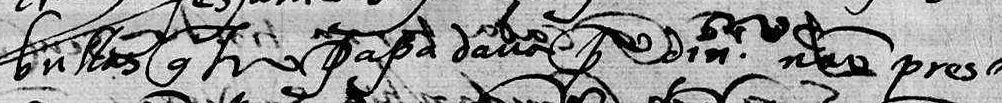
bullas q̄ ho papa daua p̄o din.ro naõ pres
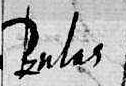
Bulas
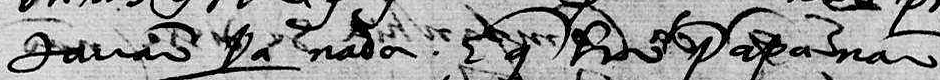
tauão ꝑa nada E q̄ ho papa naõ
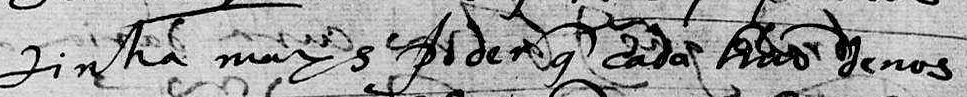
tinha mays poder q̄ cada huō de nos
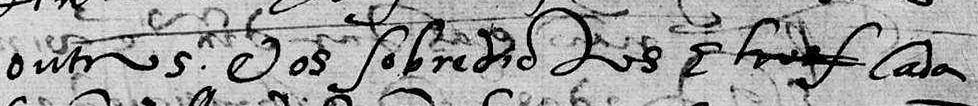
outros e os sobredictos E huas cada
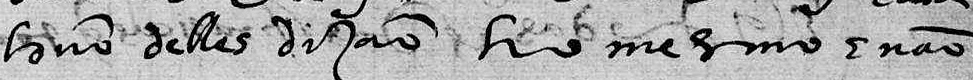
hūo delles diraõ ho mesmo E naõ
